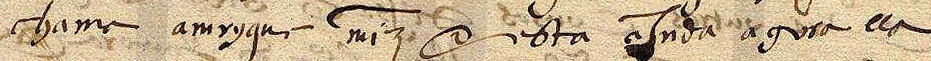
chama amryque m̅iz e esta aJnda agora lla
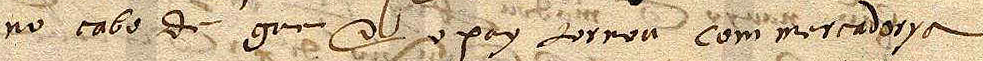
no cabo de gue e o pay tornou com mercadorya
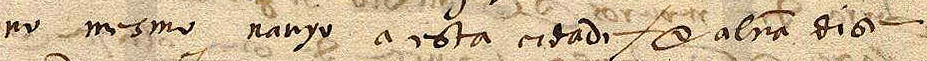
no mesmo nauyo a esta cidade / e al n̅a dise
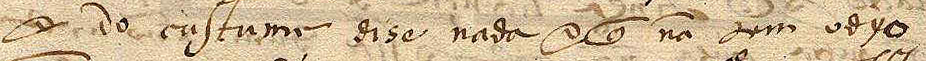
e do custume dise nada e q̅ n̅a tem odyo
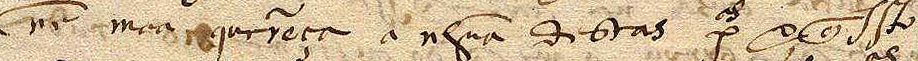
nē maa querēça a nhūa destas pas e q̅ Jsto
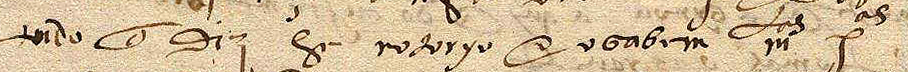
tudo q̅ diz he notoryo e o sabem mtas pas
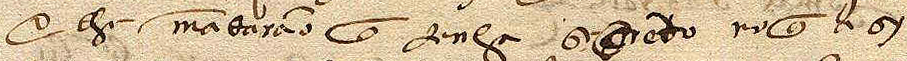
e lhe m̅adara̅o q̅ tenha segredo no q̅ asy
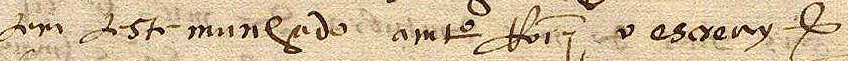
tem testemunhado amto Roīz o escreuy
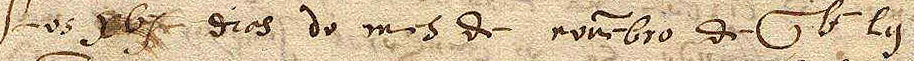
Aos xbj dias do mes de nou̅ebro de Ibc lij
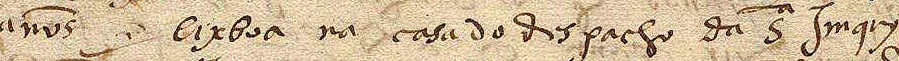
an̅os e̅ lixboa na casa do despacho da Sta Jmquy
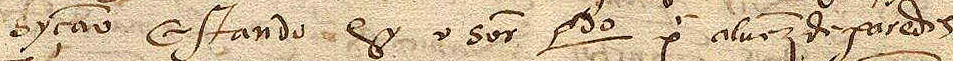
syção Estando hy o so̅r Ldo pe alu̅ez de paredes
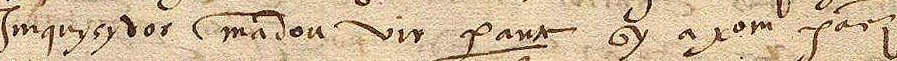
Jmquysydor m̅adou vir ꝑante sy a xom pa̅ez
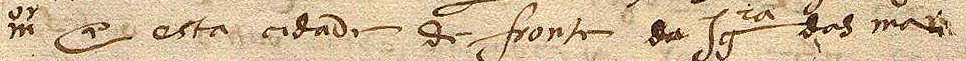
mor e̅ esta cidade defronte da Jgra das ma
